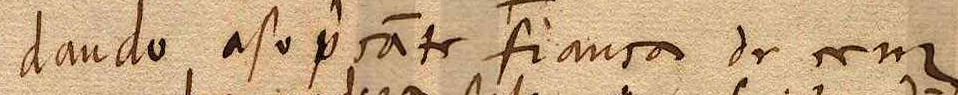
dando a sopicāte fiança de cem
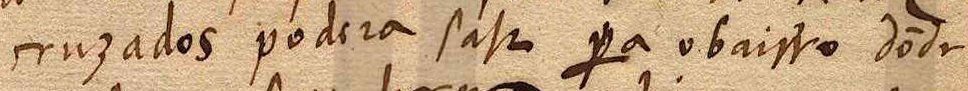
cruzados podera saJr ꝑa o bairro dōde
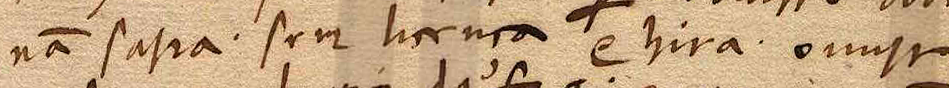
nā sajra. sem licença e hira. ouujr
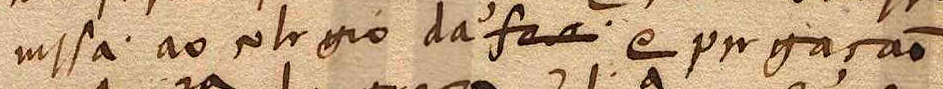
mjsa ao colegio da fee e pregaçaõ
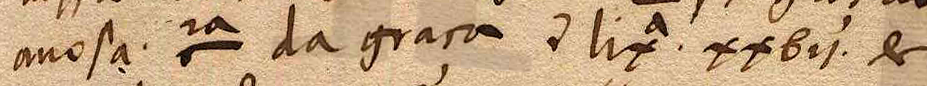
a nosa. sra da graça ē lixa. xxbij. de
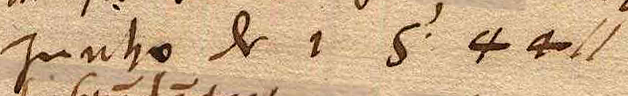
Junho de 1544 //
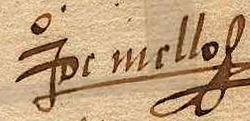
Jo de mello /
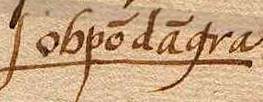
o bpō dāgra
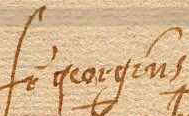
fr̄ georgius
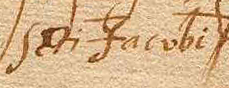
Sc̄ti Jacobi
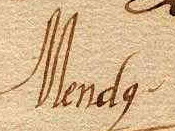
Mendꝯ
